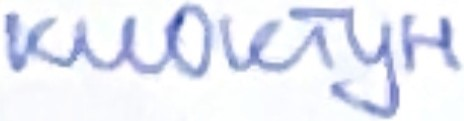клоктун
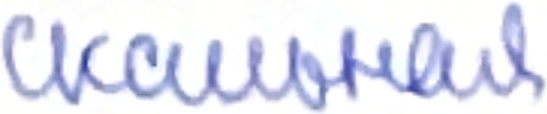скальная
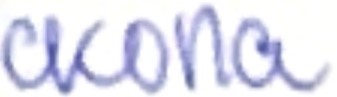скопа
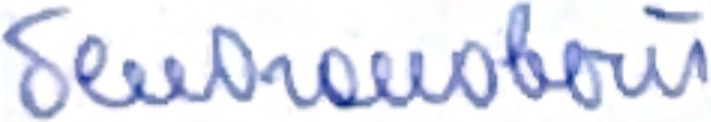белоголовый
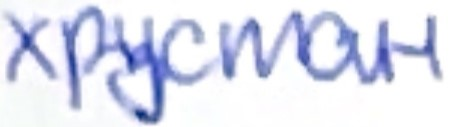хрустан
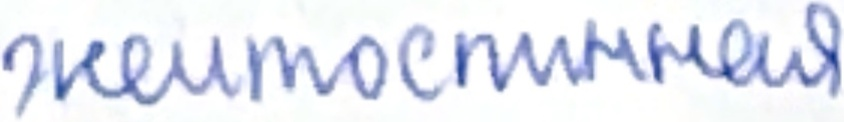желтоспинная
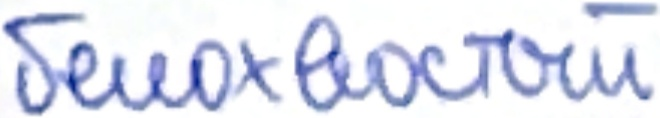белохвостый
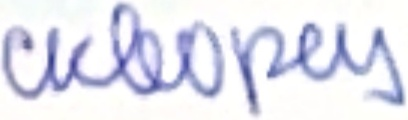скворец
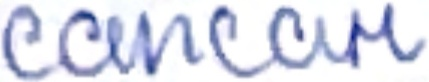сапсан
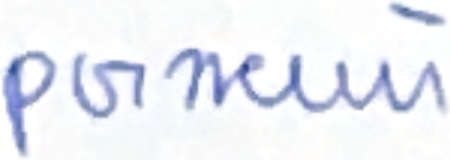рыжий
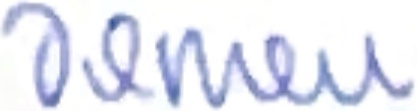дятел
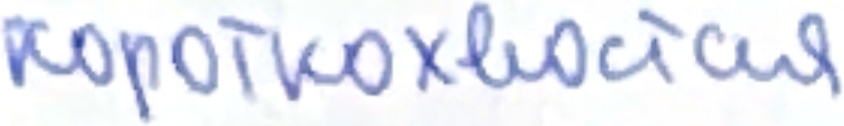короткохвостая
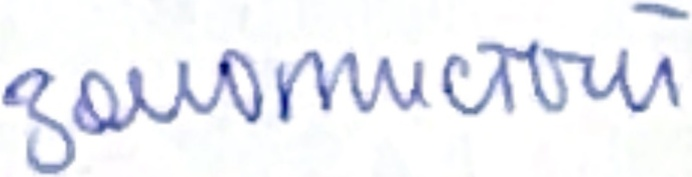золотистый
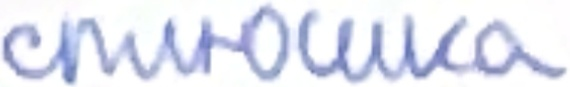сплюшка
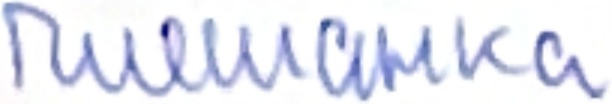плешанка
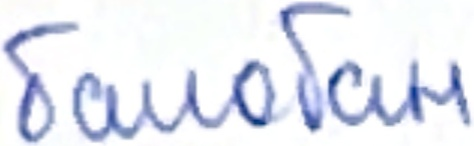балобан
